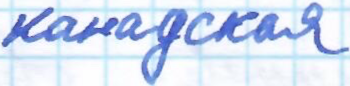канадская
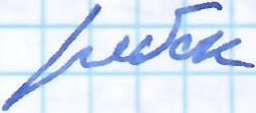рябок
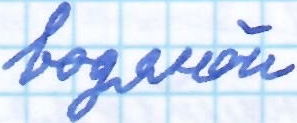водяной
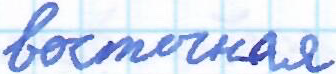восточная
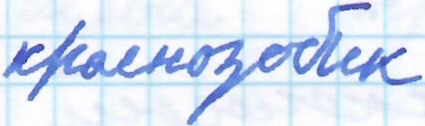краснозобик
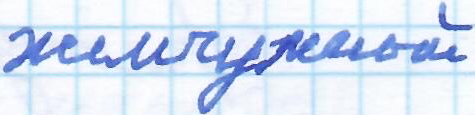жемчужный
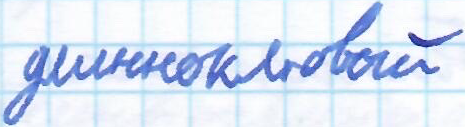длинноклювый
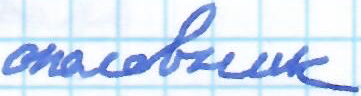ополовник
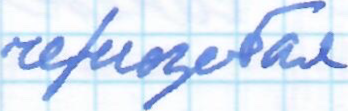чернозобая
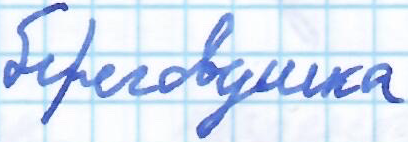береговушка
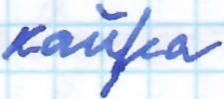кайра
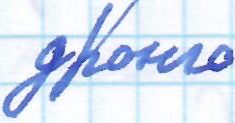дронго
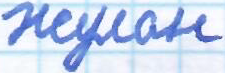жулан
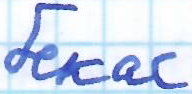бекас
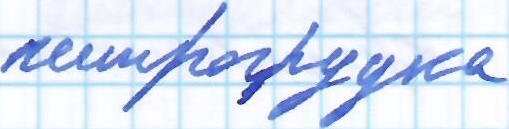пестрогрудка
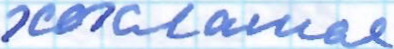хохлатая
